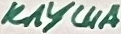клуша
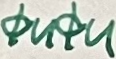фифи
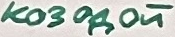козодой
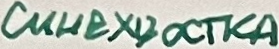синехвостка
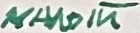малый
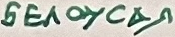белоусая
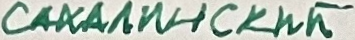сахалинский
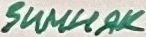зимняк
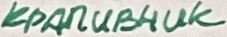крапивник
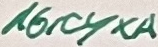лысуха
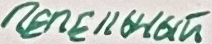пепельный
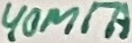чомга
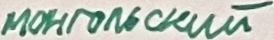монгольский
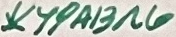журавль
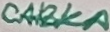савка
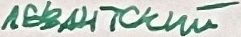левантский
